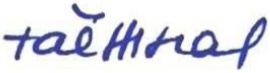таёжная
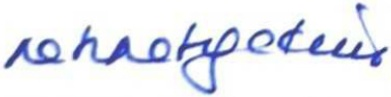лоплондский
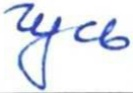гусь
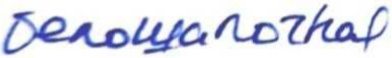белошапочная
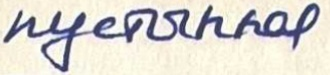пустынная
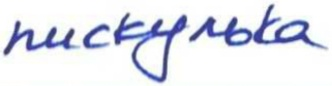пискулька
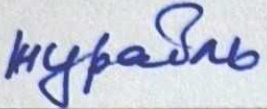журавль
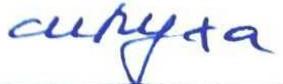сипуха
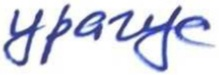урагус
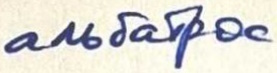альбатрос
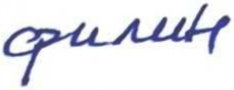филин
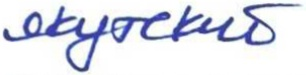якутский
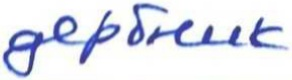дербник
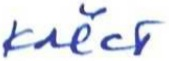клёст
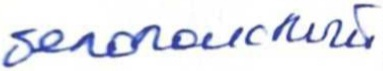белопоясный
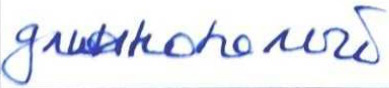длиннополый
